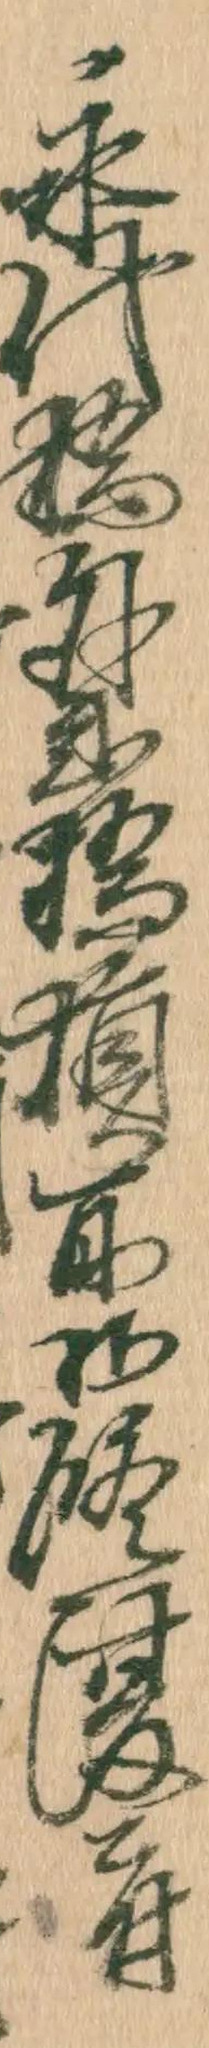永代橋外弐橋損所御修復ニ付
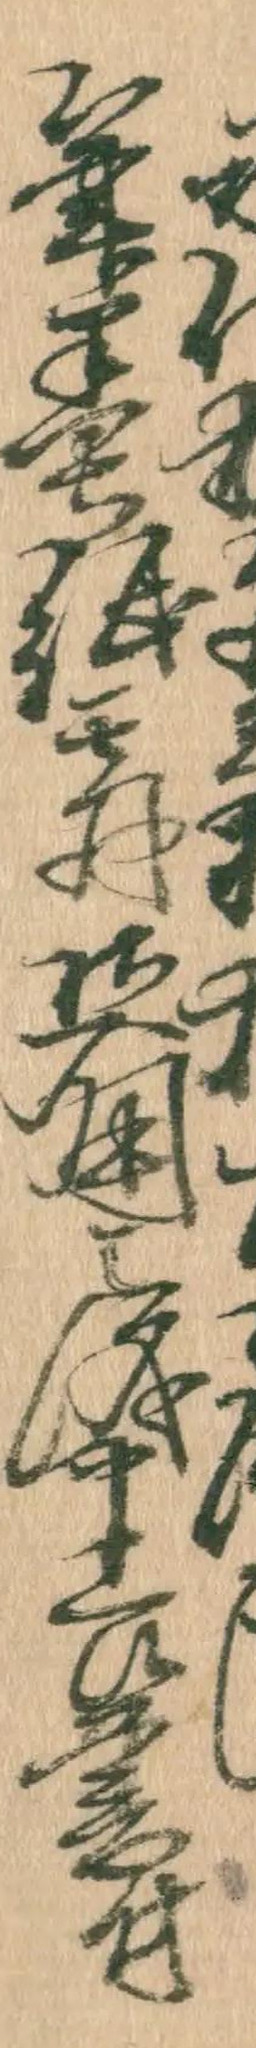筆墨紙其外御入用之儀申上候書付
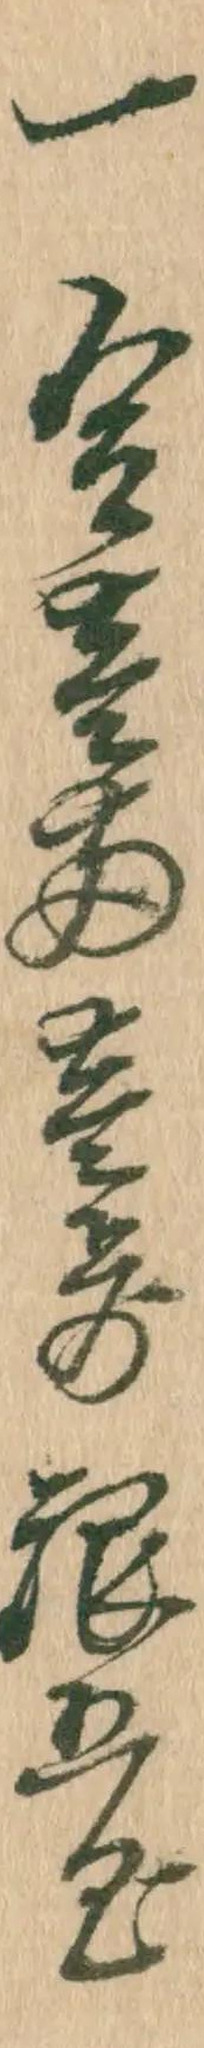一金壱両壱歩銀五匁
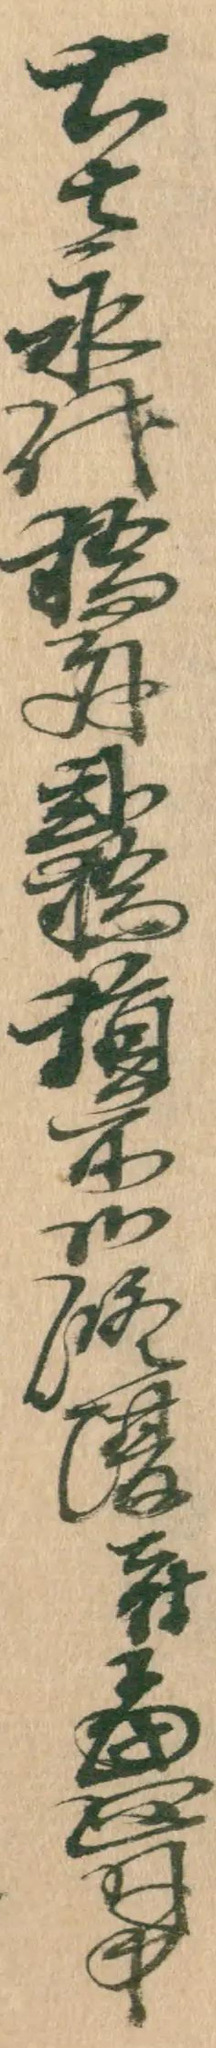右は永代橋外弐橋損所御修復ニ付当四月中
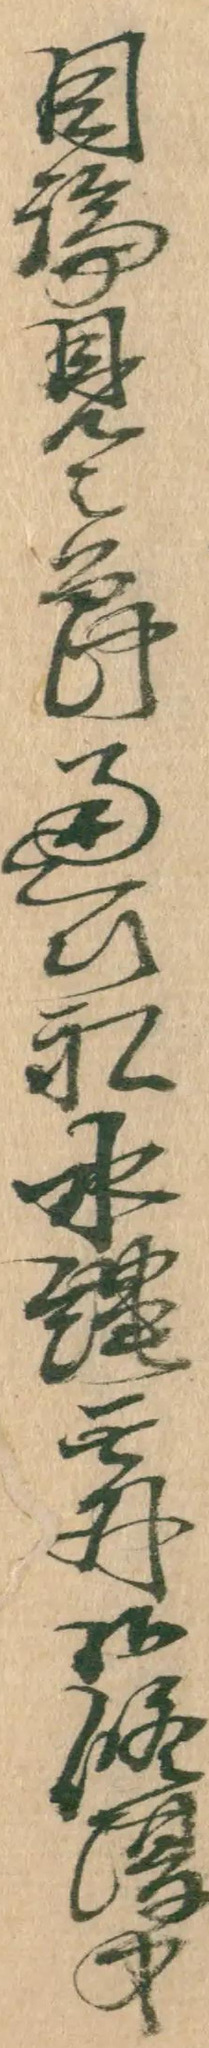目論見之節通ひ船水縄其外御修復中

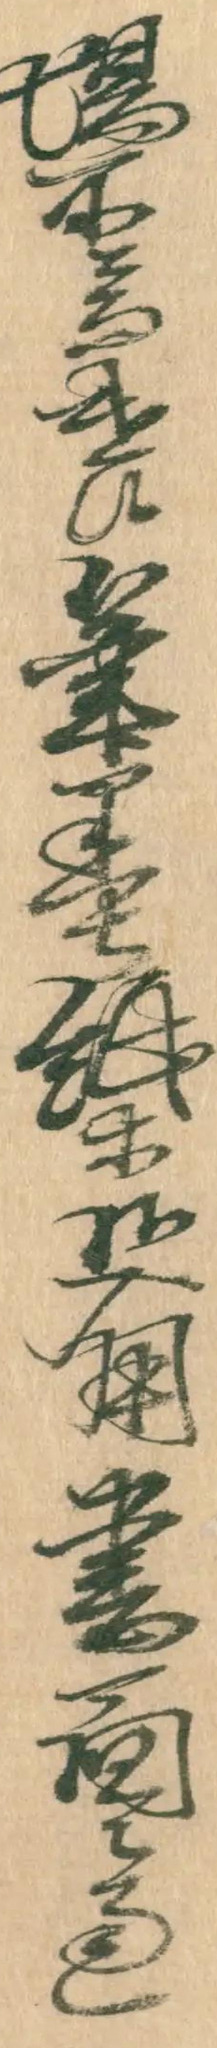場所ニ而遣候筆墨紙等御入用書面之通
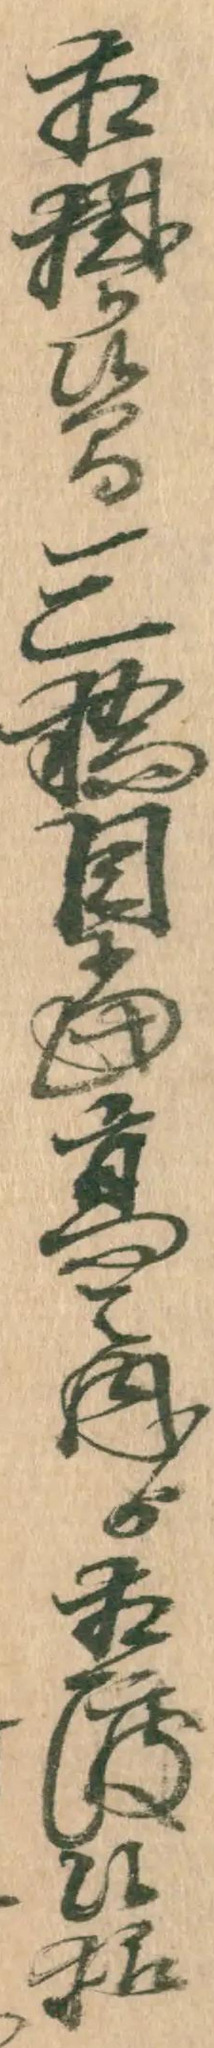相掛り候間三橋目当高之内ゟ相渡候様
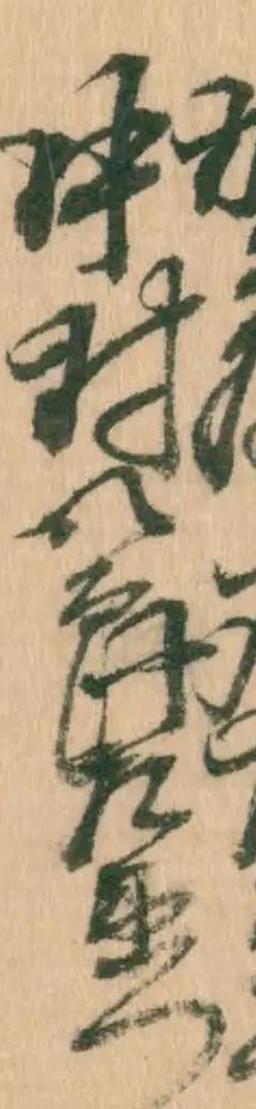中村八郎左衛門
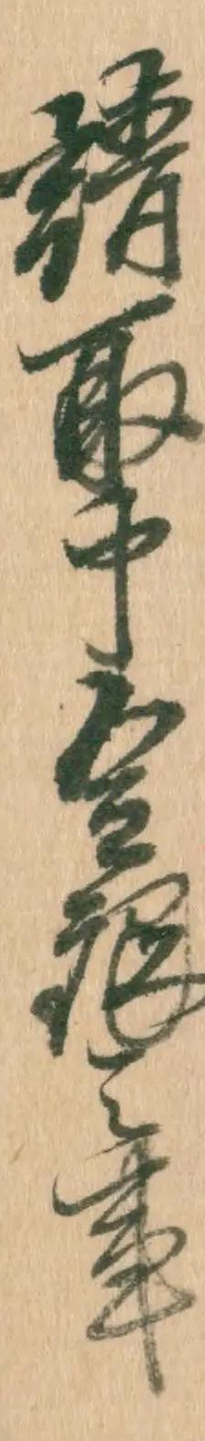請取申金銀之事
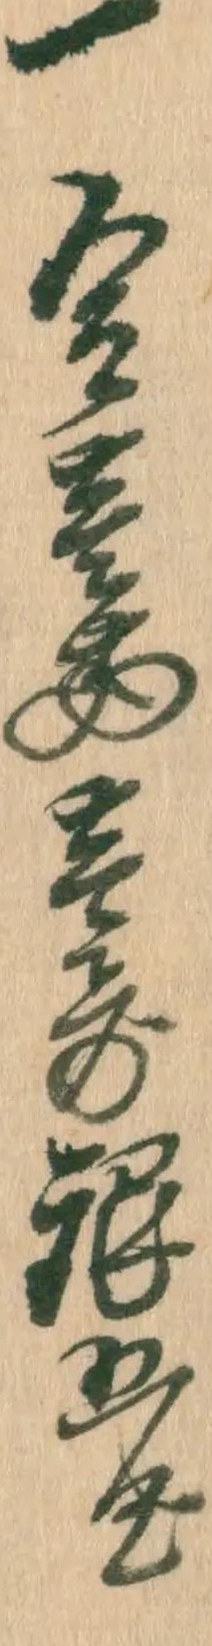一金壱両壱歩銀五匁
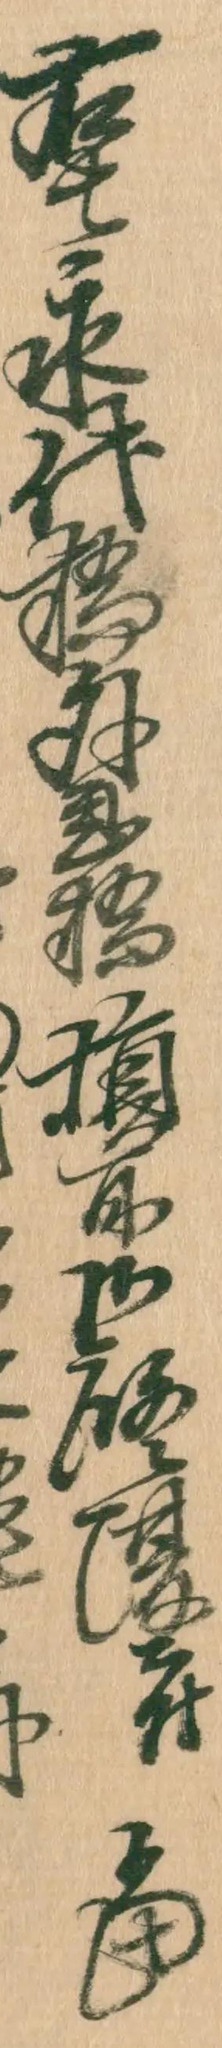右は永代橋外弐橋損所御修復ニ付当
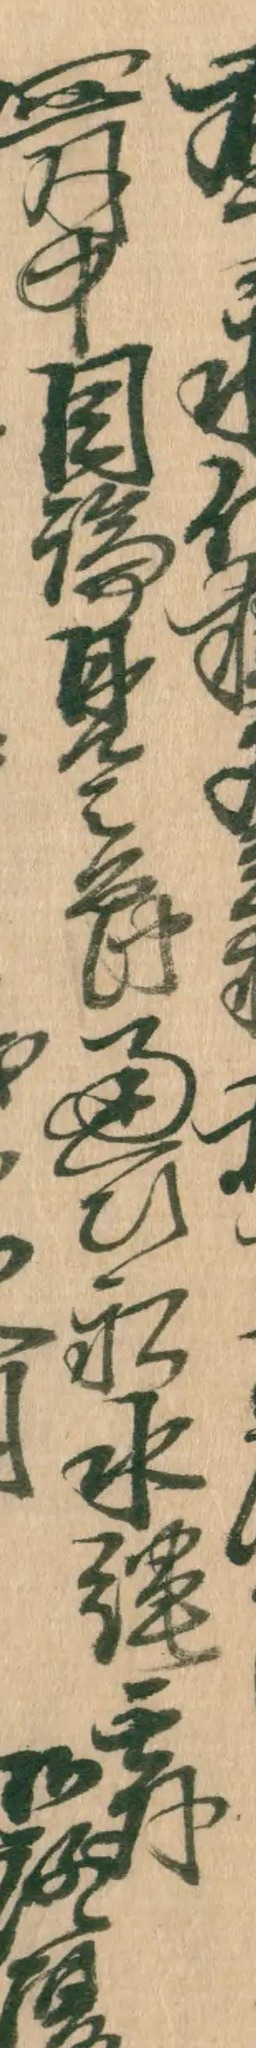四月中目論見之節通ひ船水縄其外
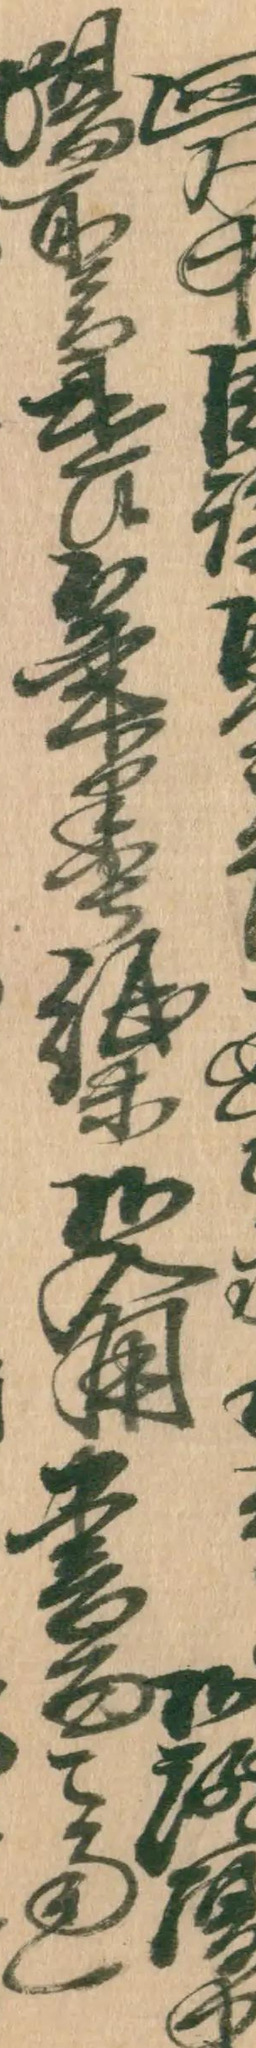場所ニ而遣候筆墨紙等御入用書面之通
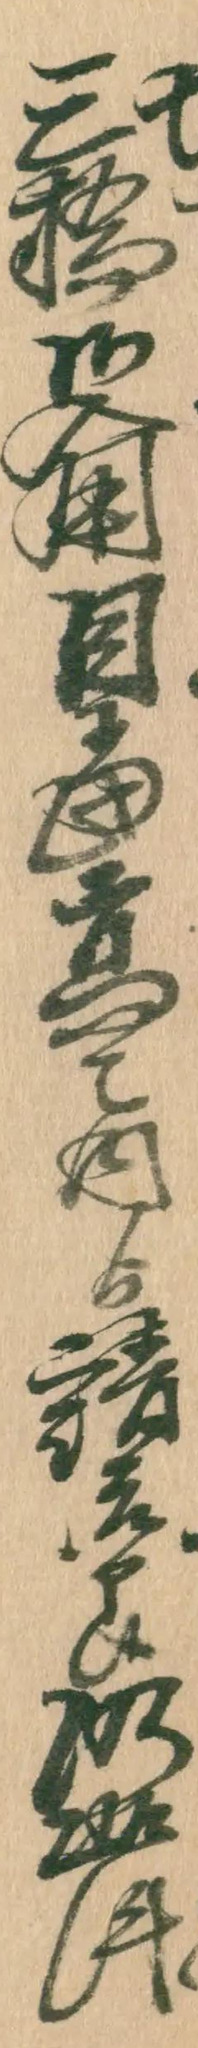三橋御入用目当高之内ゟ請取申候仍如件
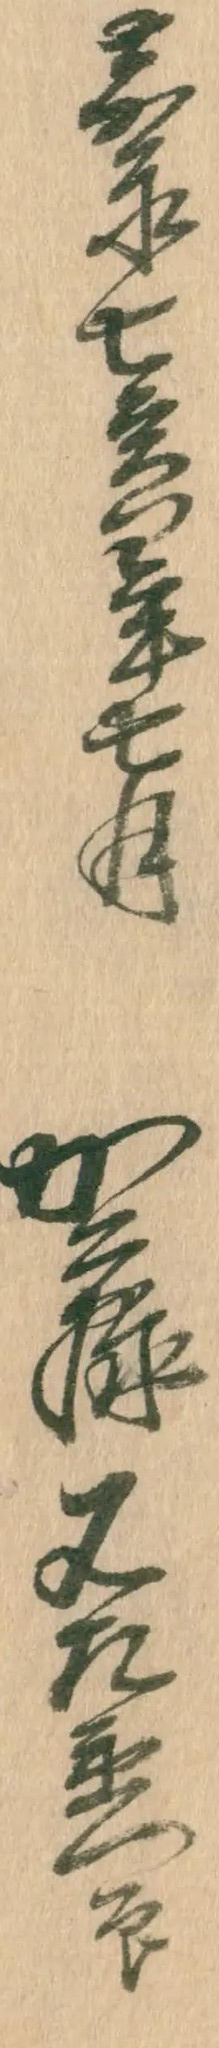嘉永七寅年七月加藤又左衛門印

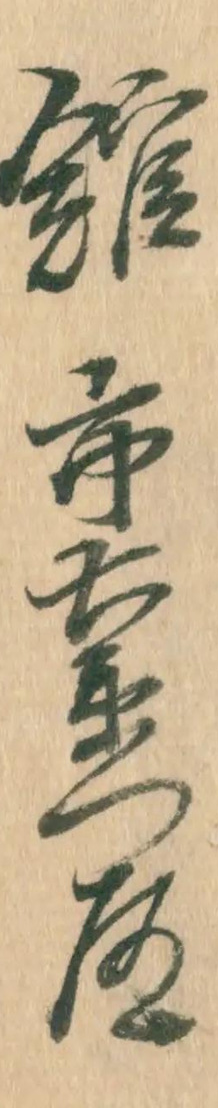館市右衛門殿
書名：三橋 17巻. [8] 三橋小破御修復書留　但御奉行御掛リ替地震潰橋番屋　嘉永四亥年より安政二卯年迄　下
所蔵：国立国会図書館 National Diet Library, JAPAN
